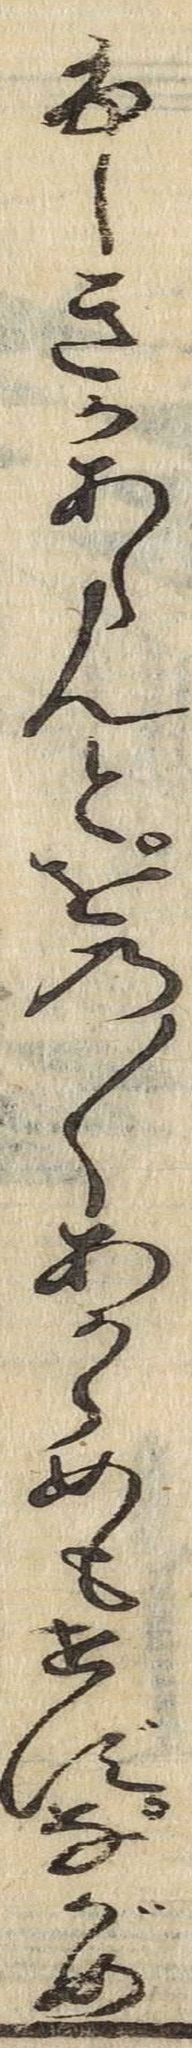けしきかあらんと。をの〳〵あからめもせず。ながめ
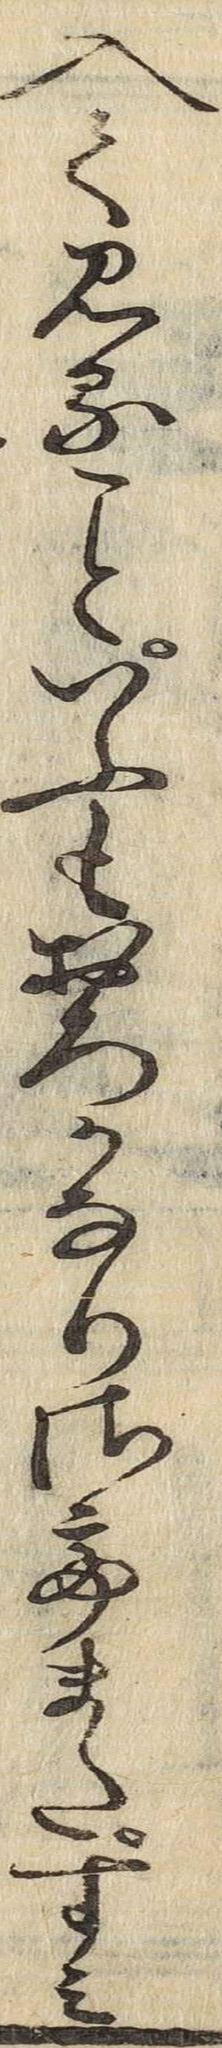入て見ること。いふもおろかなりさてまた。すみ
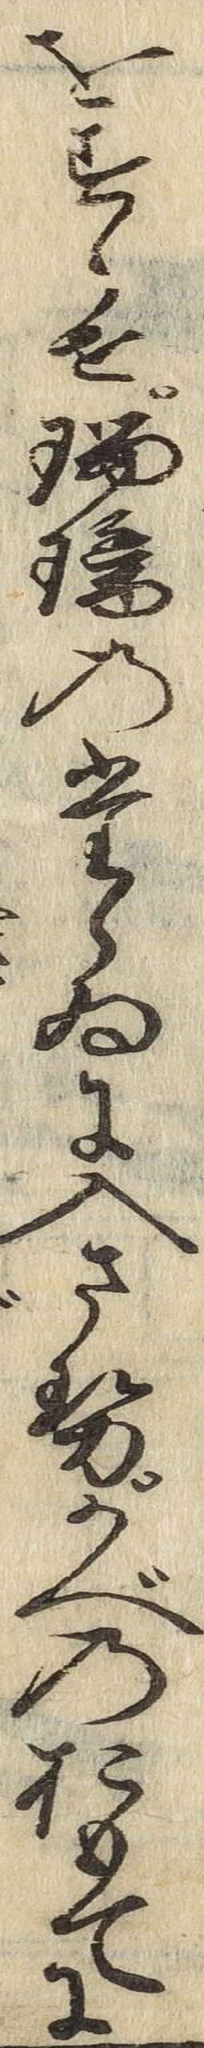をすらせ。瑠璃のたらゐに入させ。かべのおもてに
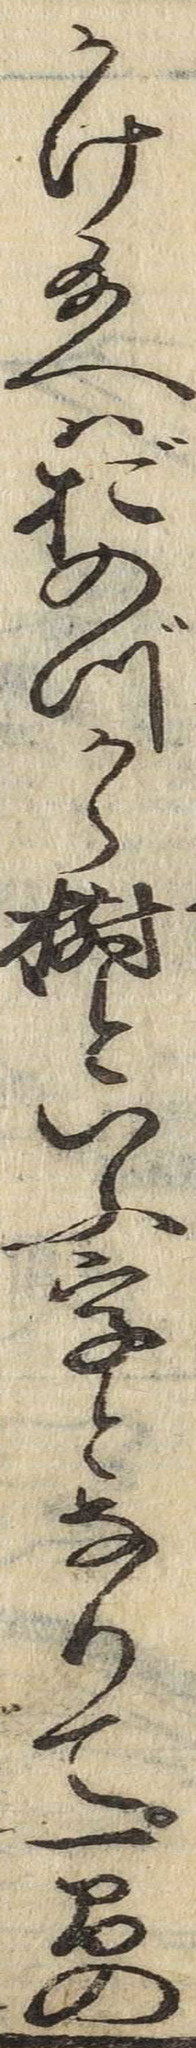かけ給へばおのづから樹といふ字となりて。一間の
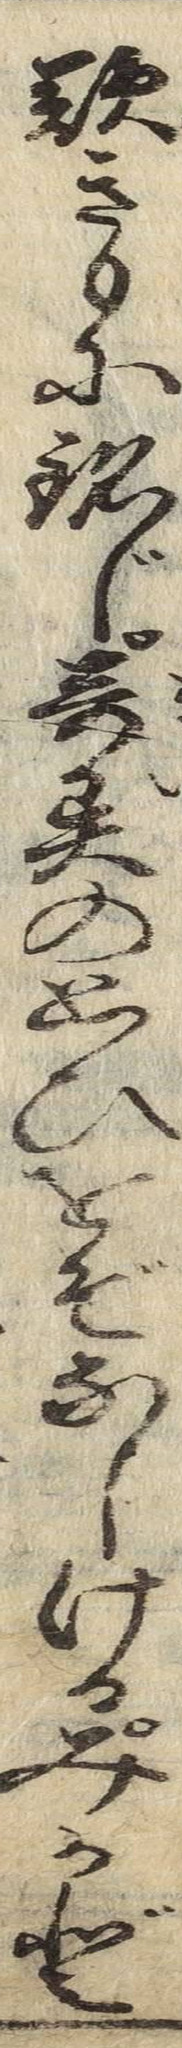歎きもに銘じ。奇異の思ひをぞなしける。みかど
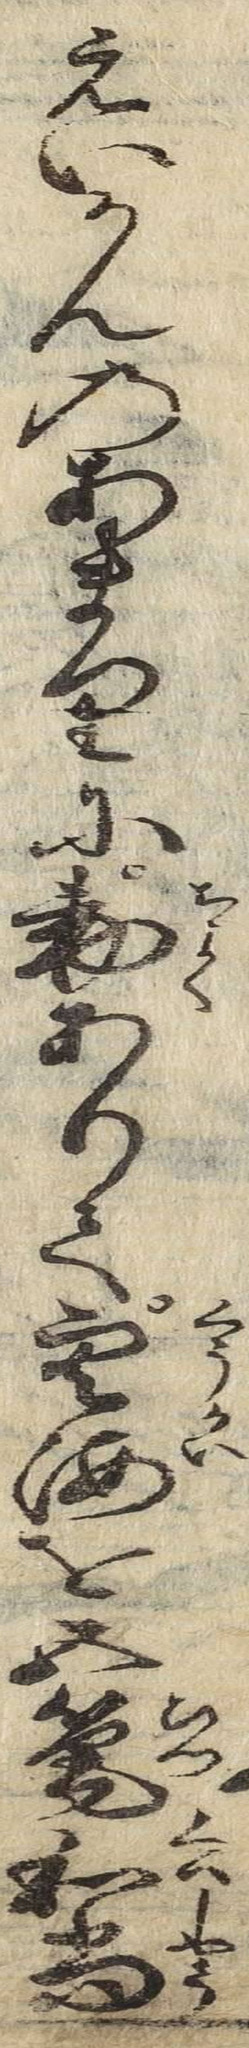えいらんのあまりに。勅あありて。空海を五筆和尚
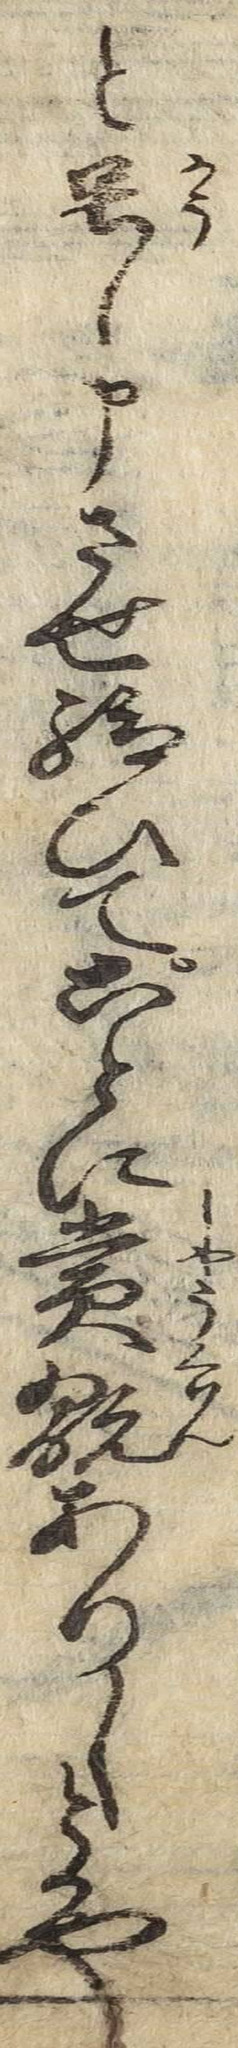と号し申させ給ひて。ことに賞観ありしとかや

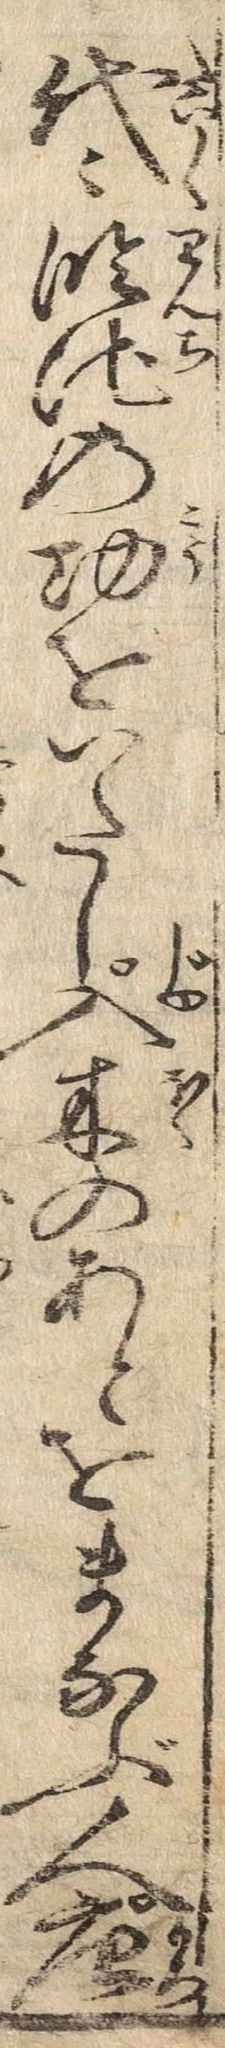代々隣地の功をいたし。入木のあとをまなぶ人。唐
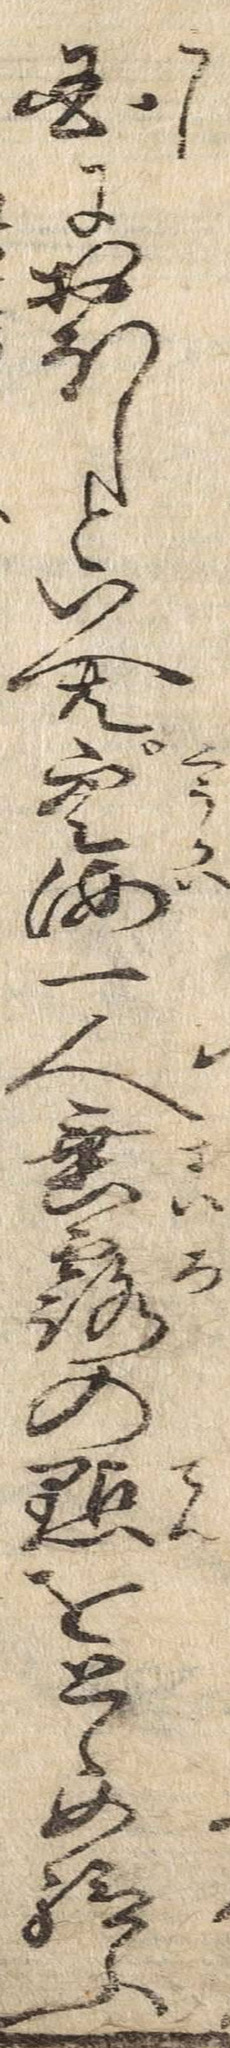国におほしといへ共。空海一人垂露の点をとゝめ給ふ
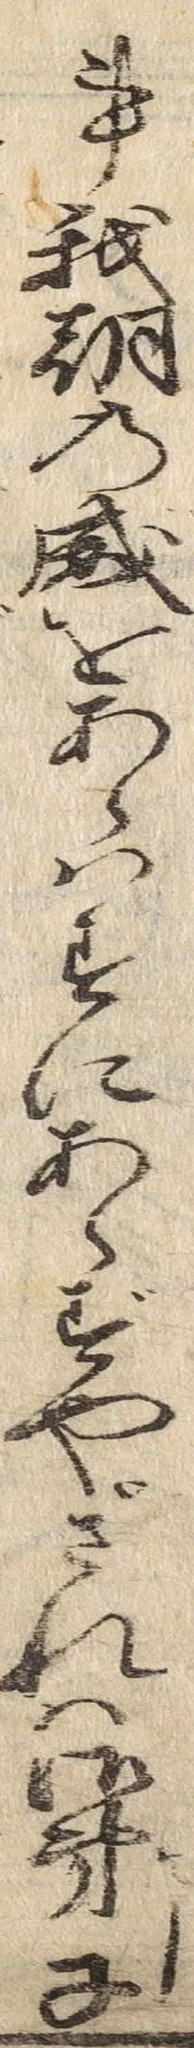事我朝の威をあらはすにあらずや。されは御弟子
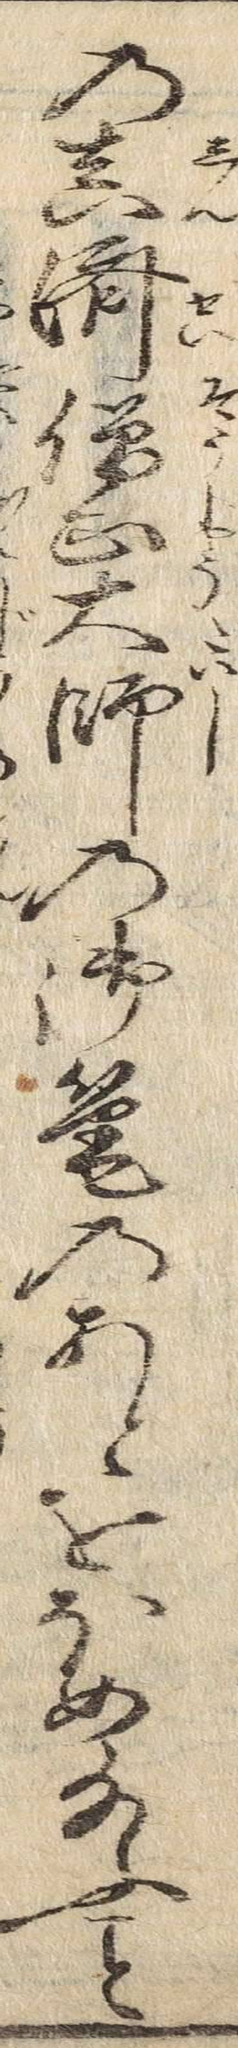の真済僧正大師の御筆のあとをほめ給ふこと
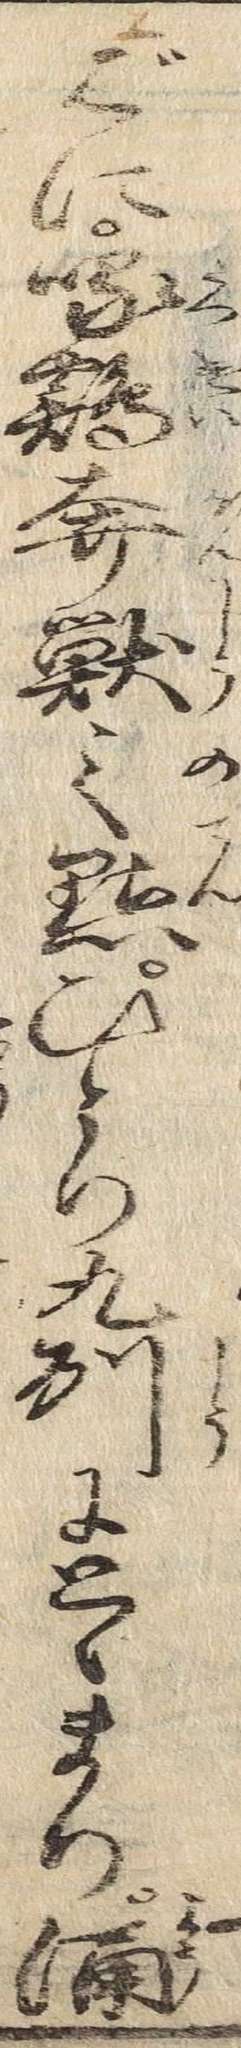ばに。啄鶏奔獣之点。ひとり九州にとゝまり。涌
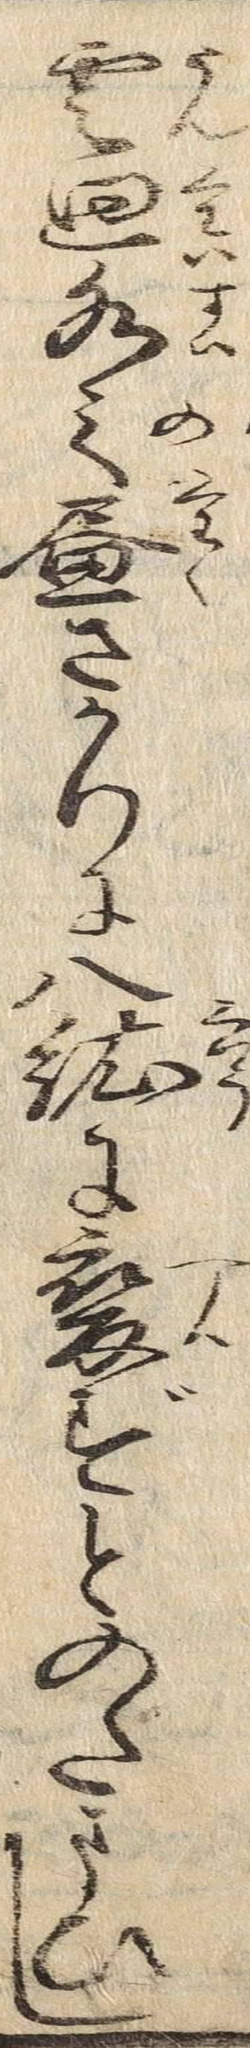雲廻水之画さかりに八紘に変ずとのたまひし
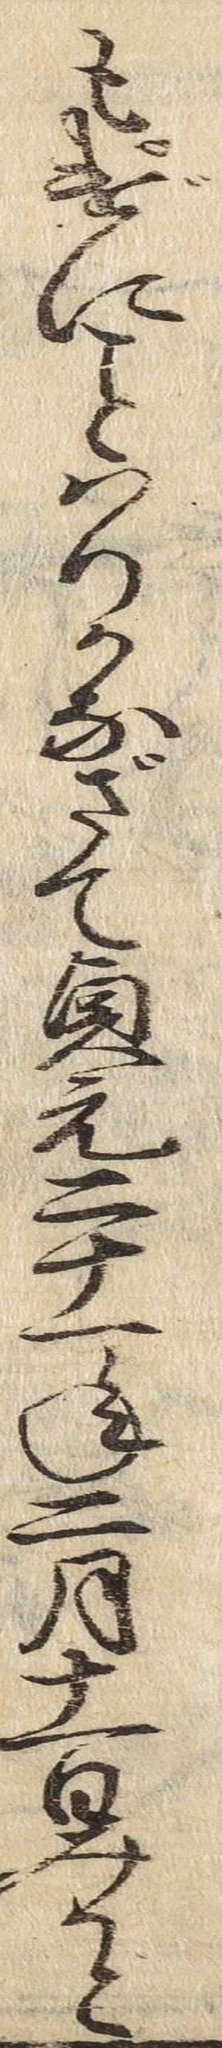も。けにことはりかな。さて貞元二十一年二月十一日みかと
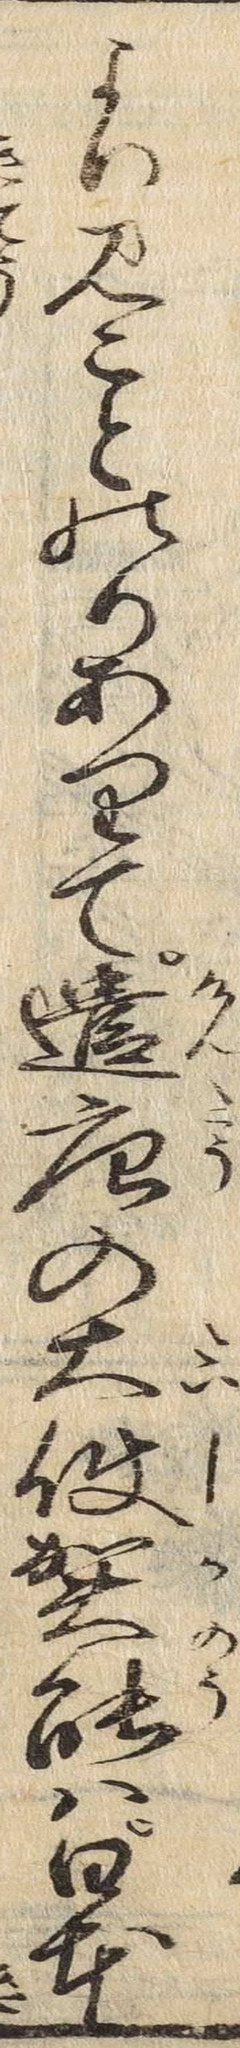よりみことのりありて遣唐の大使賀能は。日本
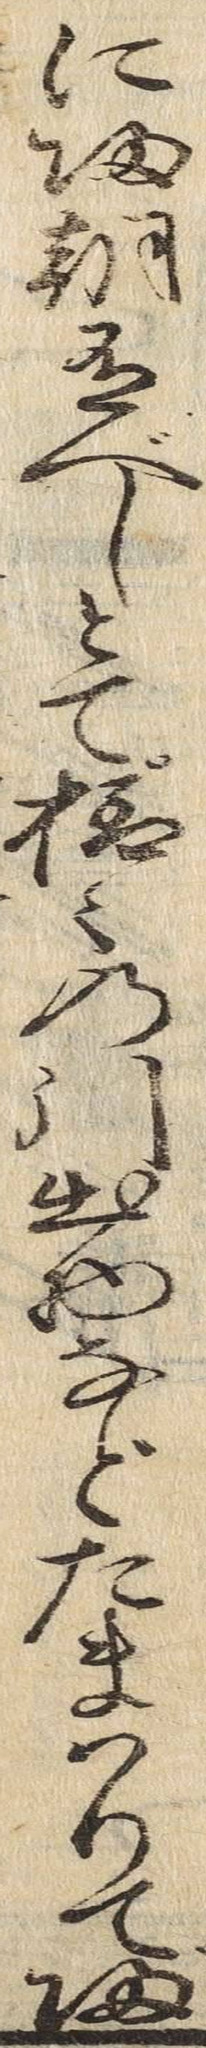に帰朝有べしとて。様々の引出物などたまはりて。帰
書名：弘法大師御傳記
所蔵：京都府立京都学・歴彩館 国文学研究資料館
